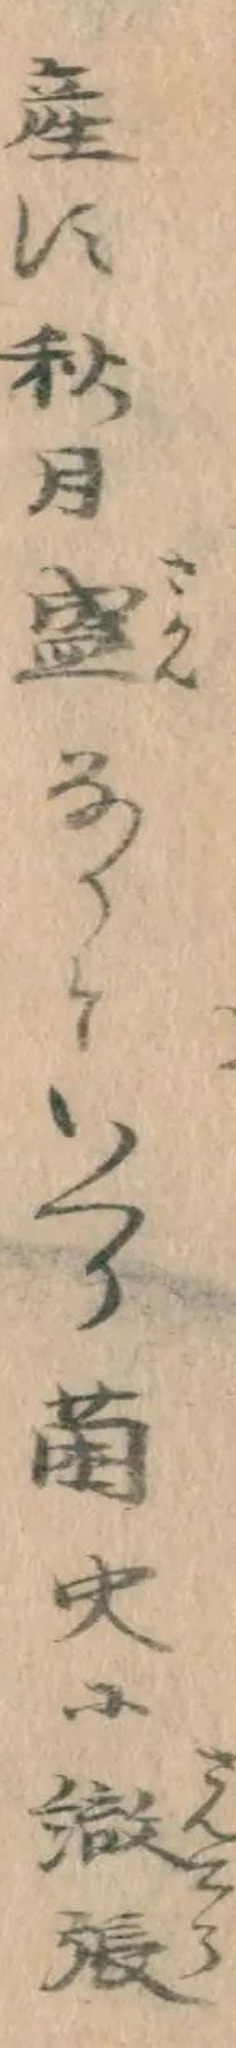産す秋月盛なりといへり菌史に張
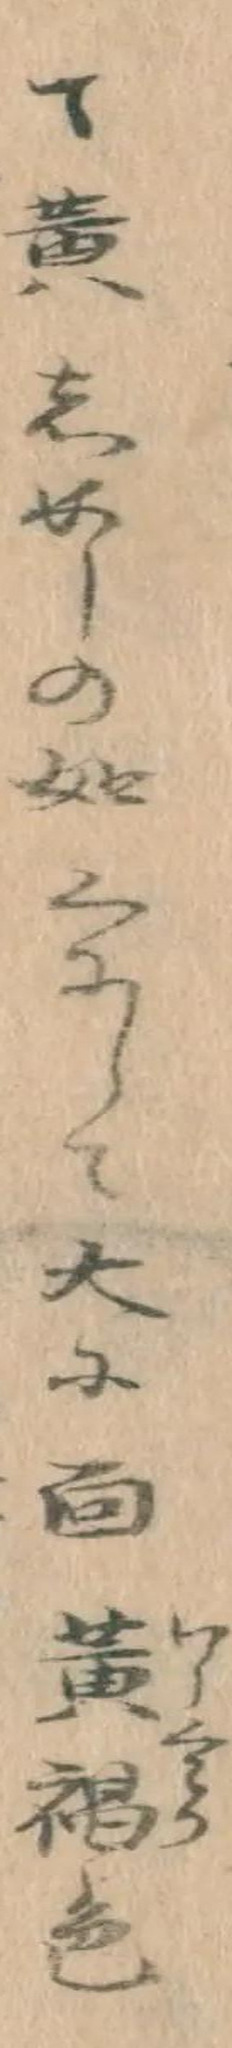て黄しめしの如くにして大に面黄褐色
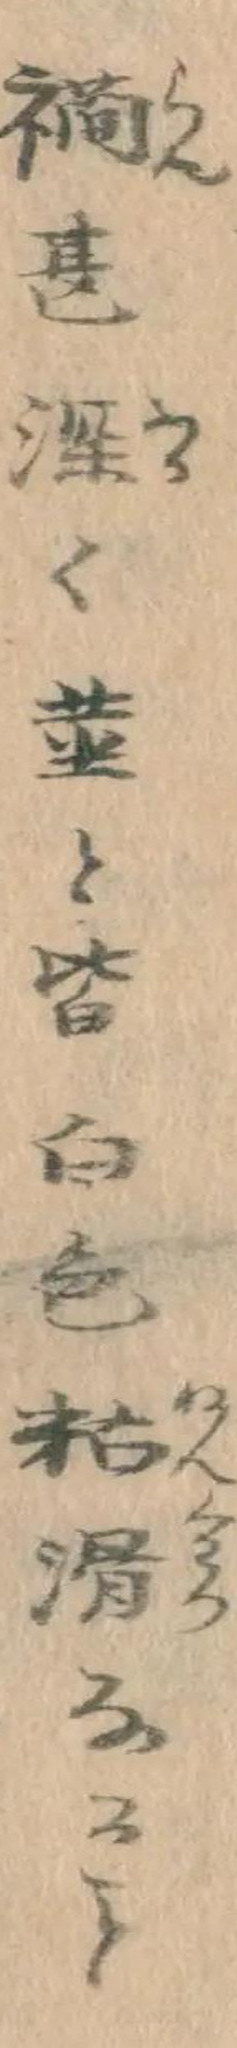甚深く茎と皆白色粘滑なること
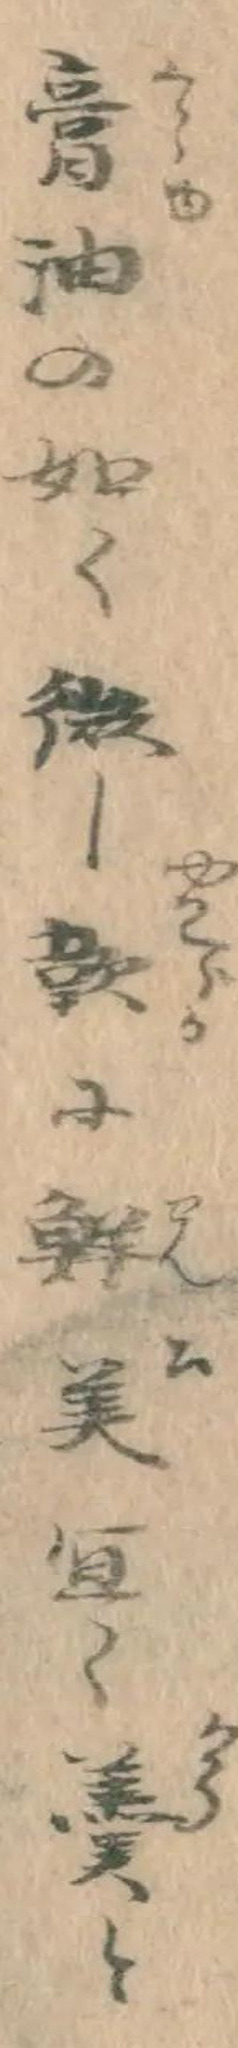膏油の如く微しに鮮美宜く羹と
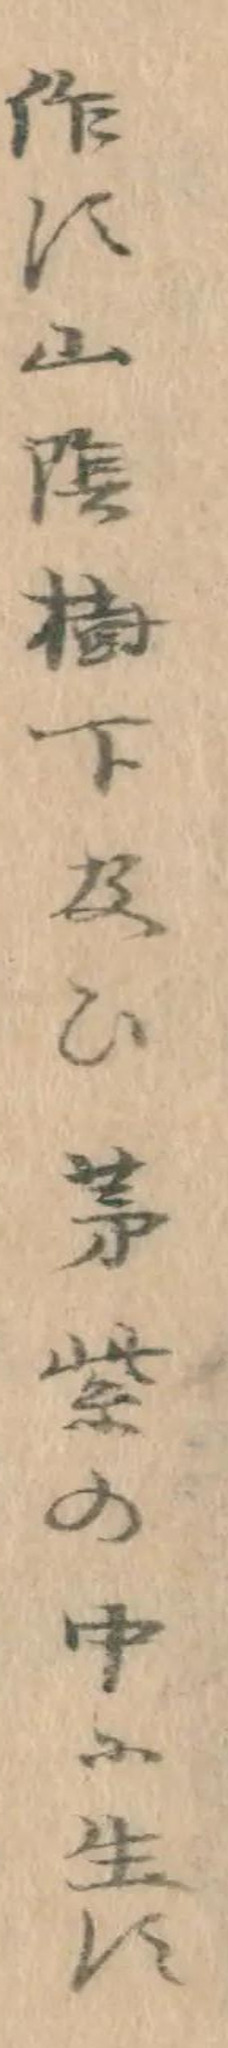作す山陰樹下及ひ茅紫の中に生す
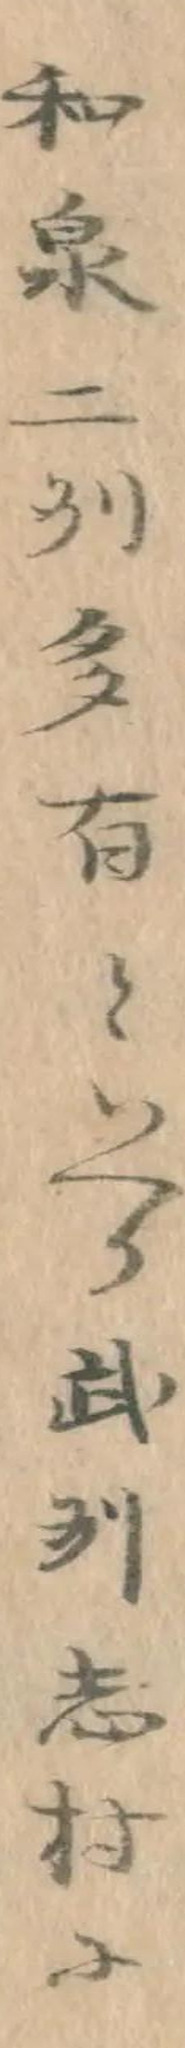和泉二州多有といへり武州志村に
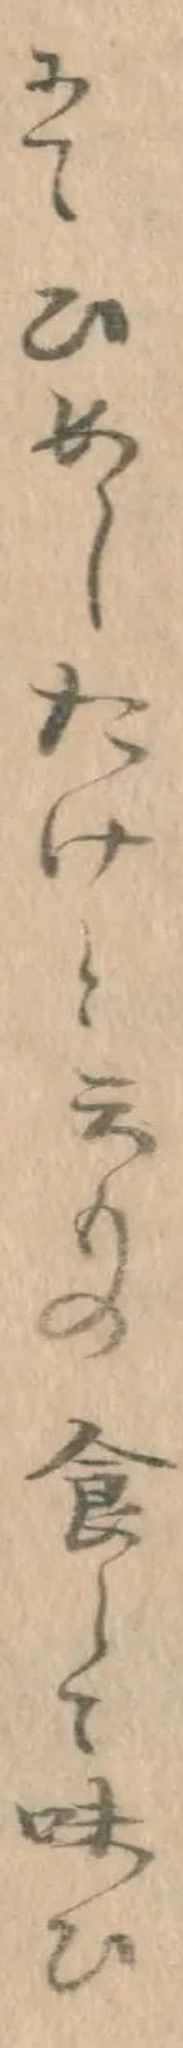にてひめしたけと云もの食して味ひ
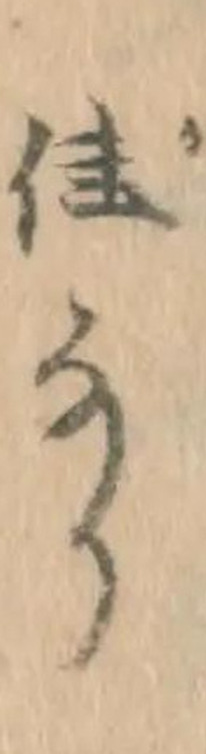佳なり

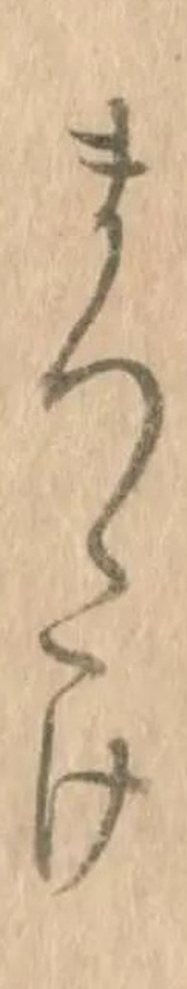まつだけ
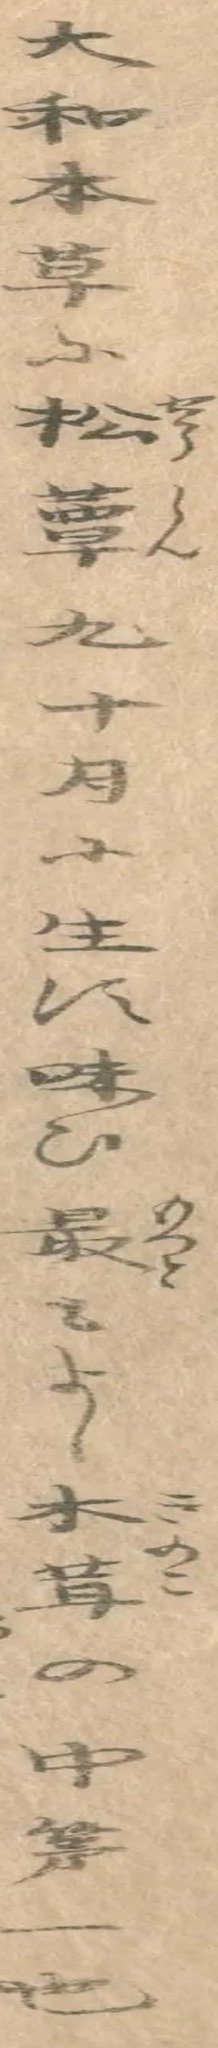大和本草に松蕈九十月に生す味ひ最もよし木茸の中第一也
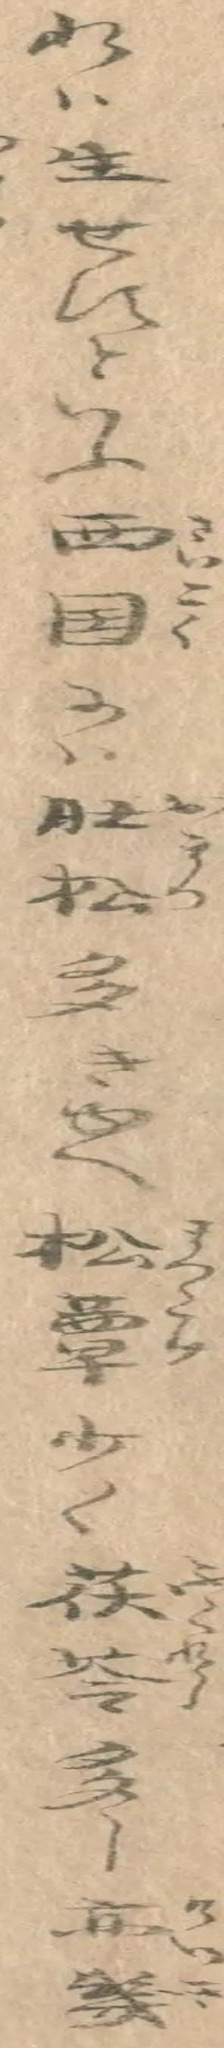れは生せすといふ西国には肚松多きゆへ松蕈少く茯苓多し亦幾
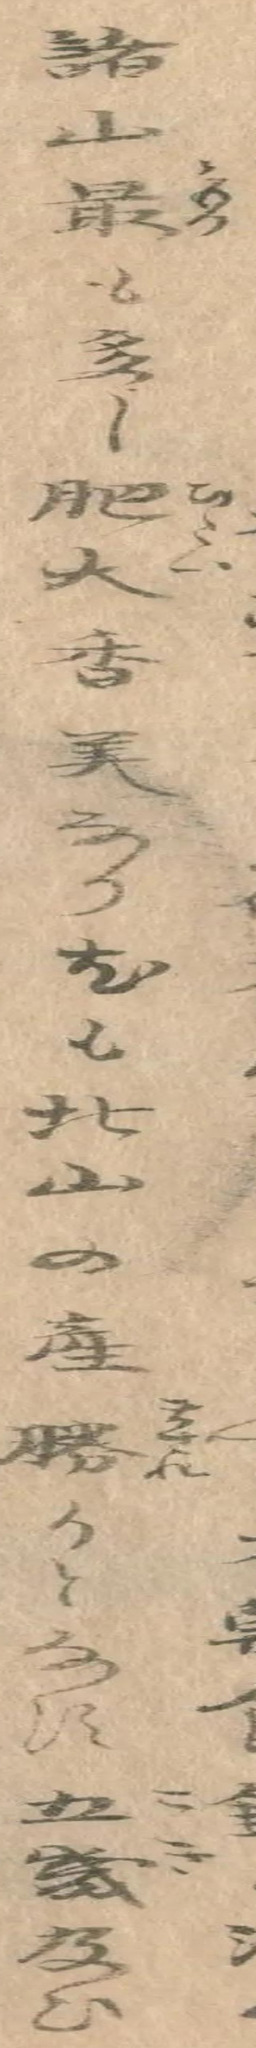諸山最も多し肥大香美なり尤も北山の産勝りとなす五幾及ひ
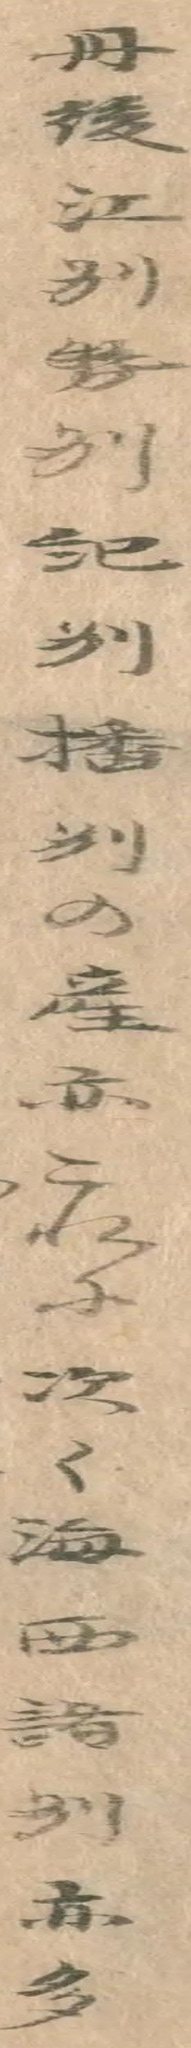丹後江州勢州紀修播州の産亦これに次く海西諸州亦多
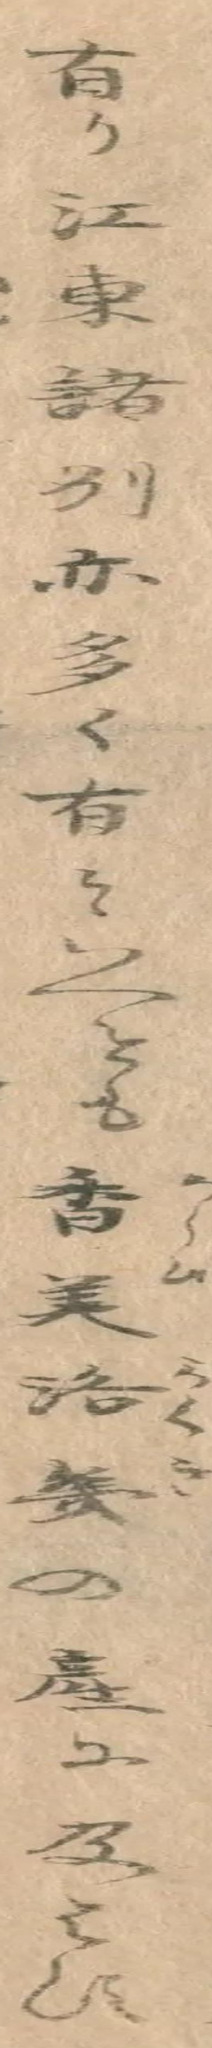有り江東諸州亦多く有といへとも香美洛幾の産に及はす
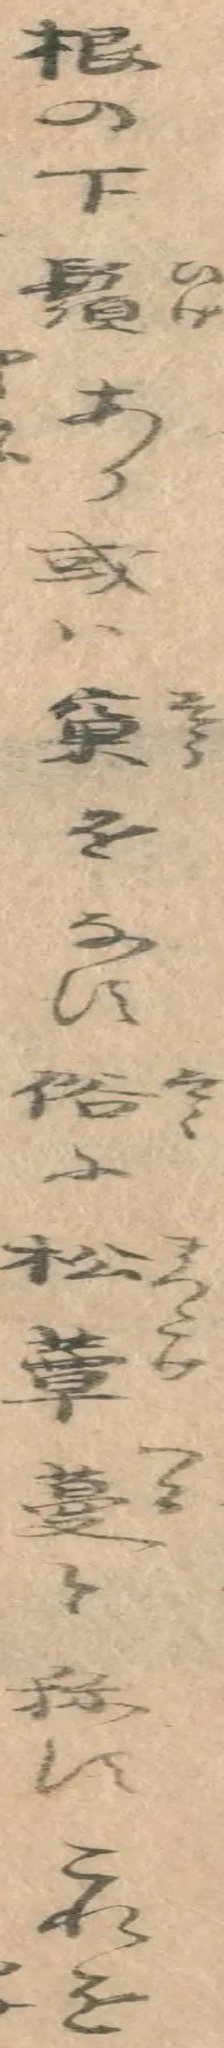根の下鬚あり或は窠をなす俗に松蕈蔓と称すこれを
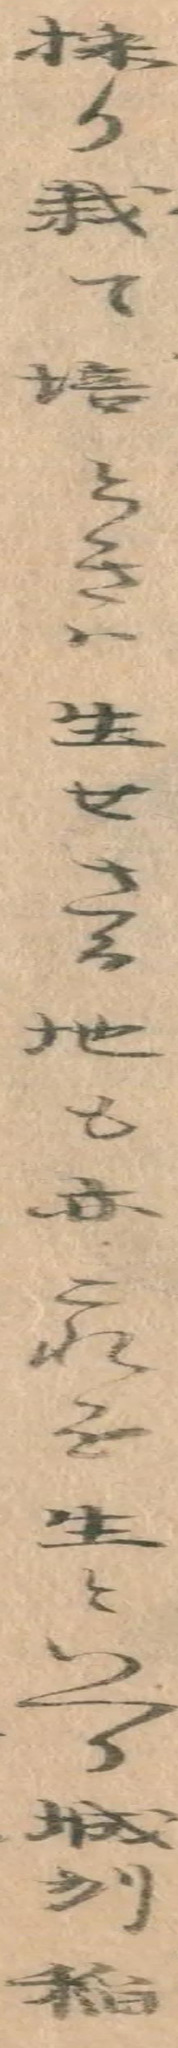採り栽て培ときは生せさる地も亦これを生といへり城州稲
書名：本草図譜. 巻55-57
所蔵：国立国会図書館 National Diet Library, JAPAN
